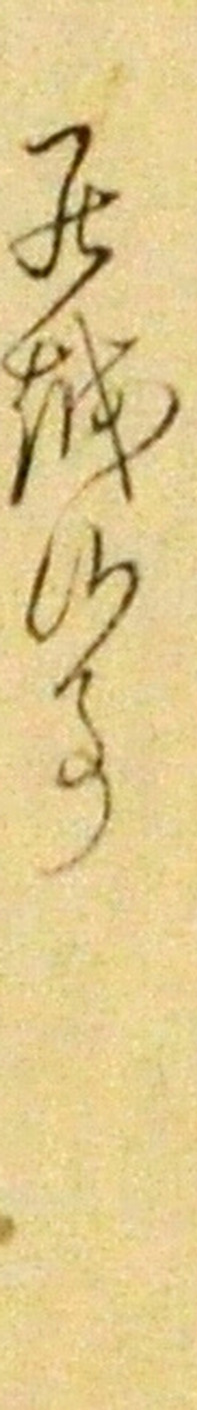罷越候事
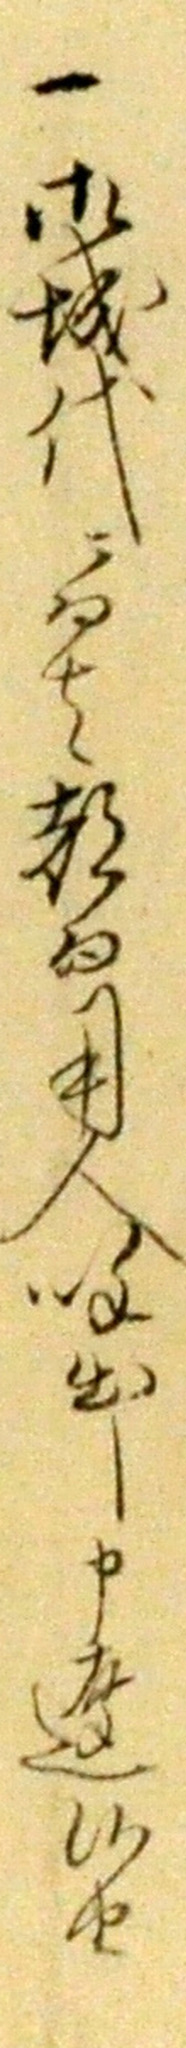一御城代ニ而者都而用人呼出し申達候由
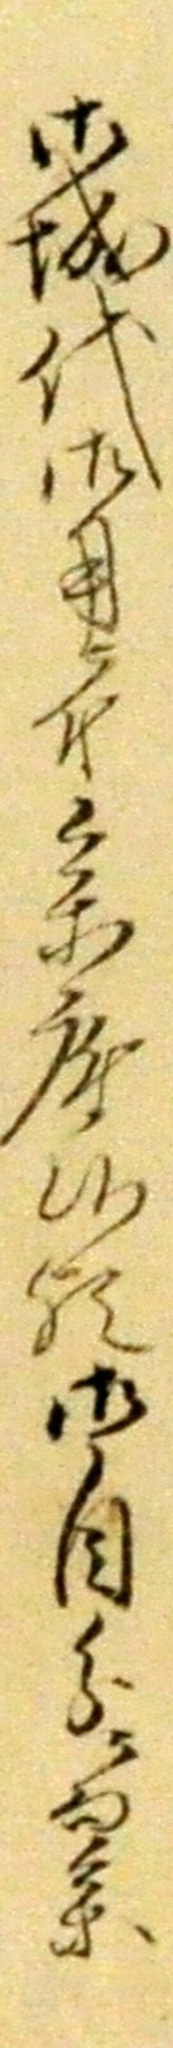御城代御用ニ付参府候歟御自分ニ而参
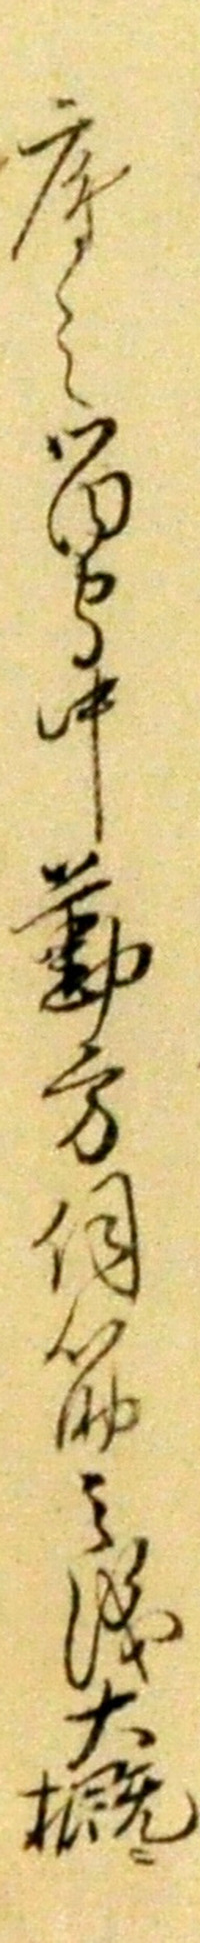府之留守中勤方伺筋之儀大概ニ

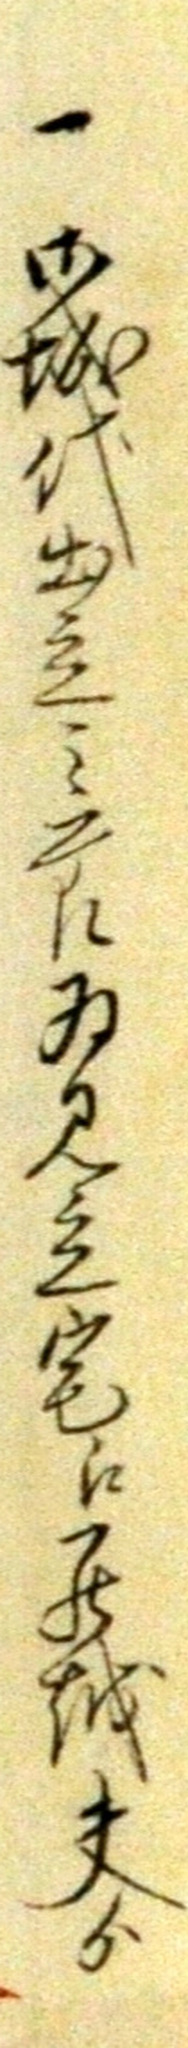御城代出立之節為見立宅え罷越夫ゟ
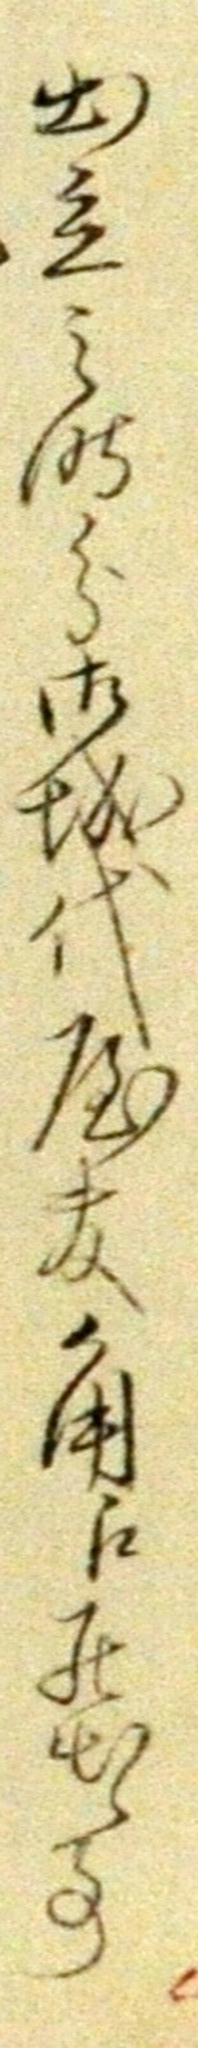出立之時分御城代屋敷角え罷出候事
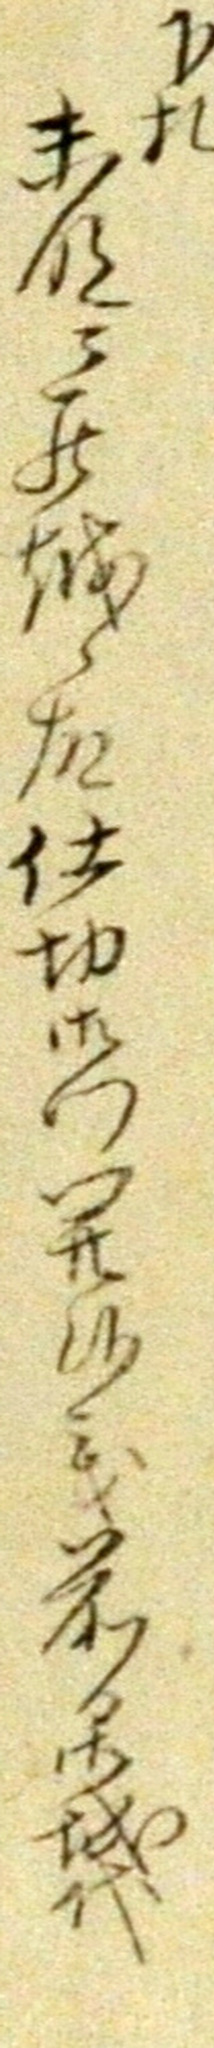未明ニ罷越候故仕切御門開候義前々御城代
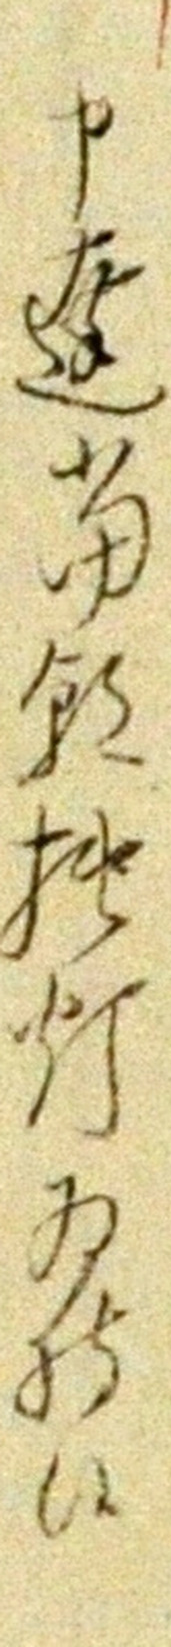申達当朝提灯為持候
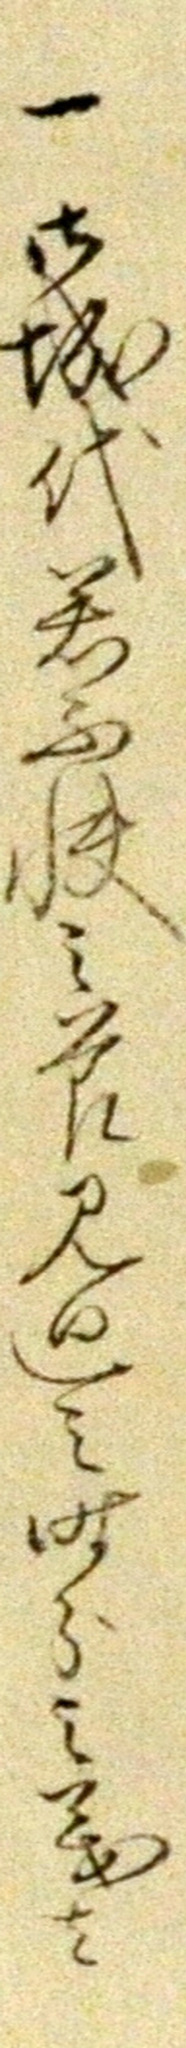一御城代若不快之節見廻之時分之義者
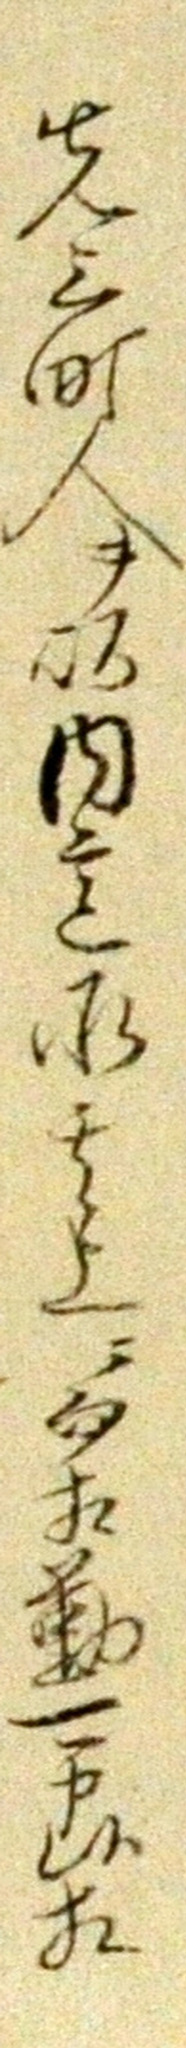先三町人ヲ以内意承其上ニ而相勤可申候相
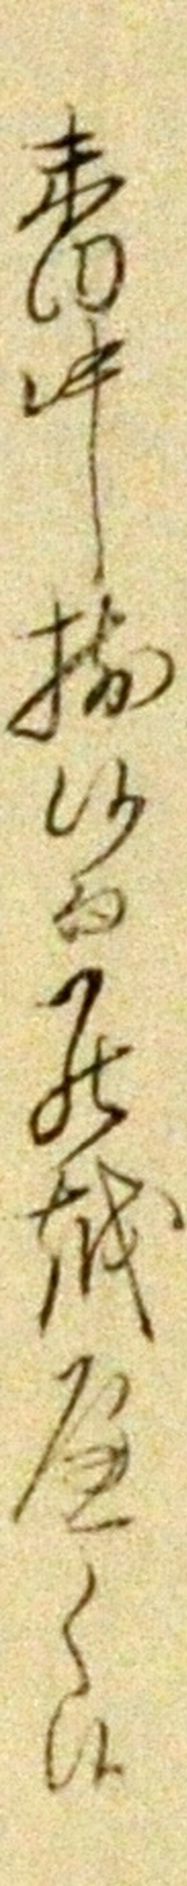番中揃候而罷越へく候
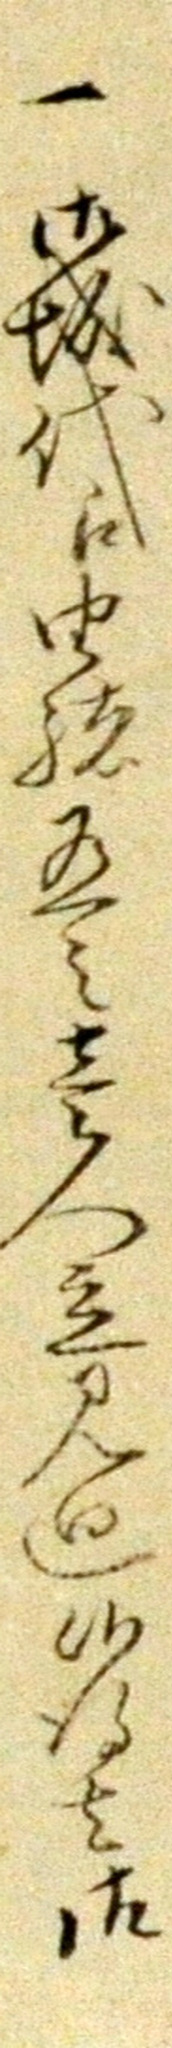一御城代え由緒有之壱人立見廻候得者御
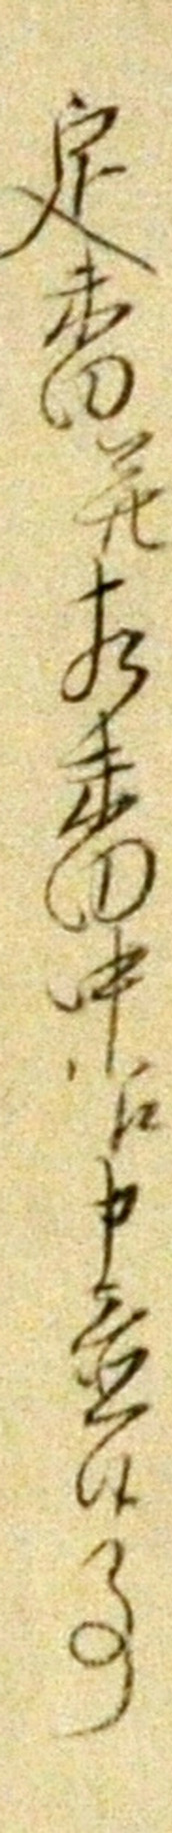定番并相番中え申置候事
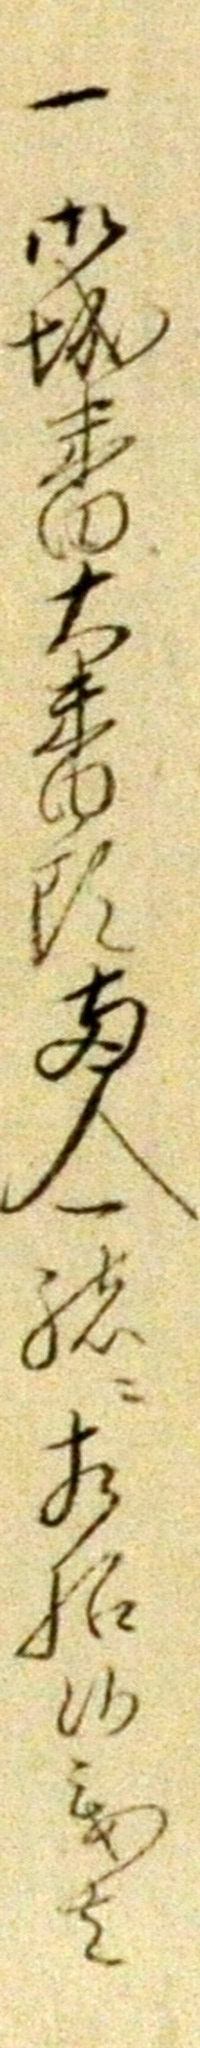一御城番大番頭両人一緒ニ相招候義者
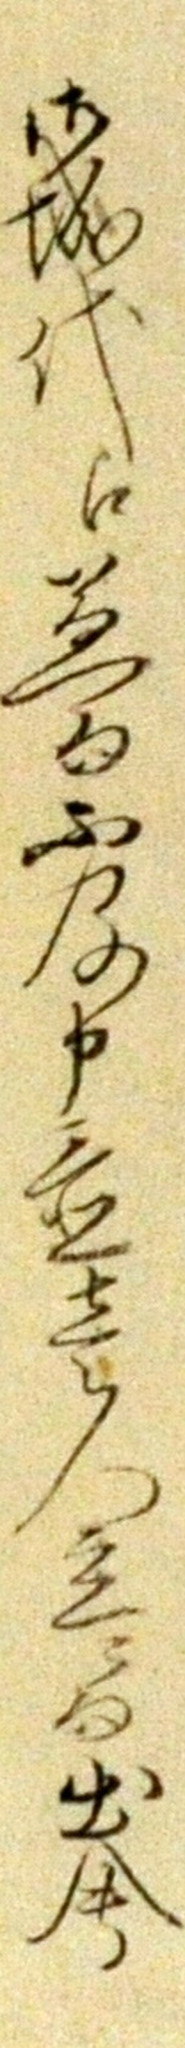御城代え兼而不及申置壱人立ニ而出会
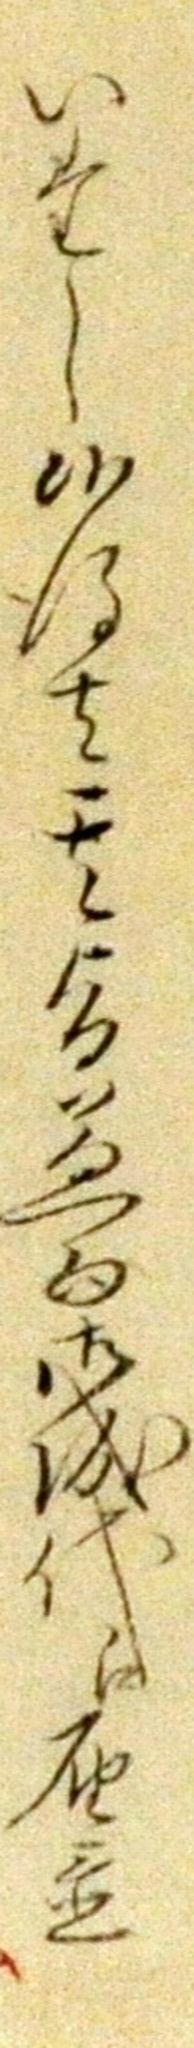いたし候得者其旨兼而御城代え届置
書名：大阪加番関係諸書留〔一括〕
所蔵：伊那市立高遠町図書館・合同会社AMANE
